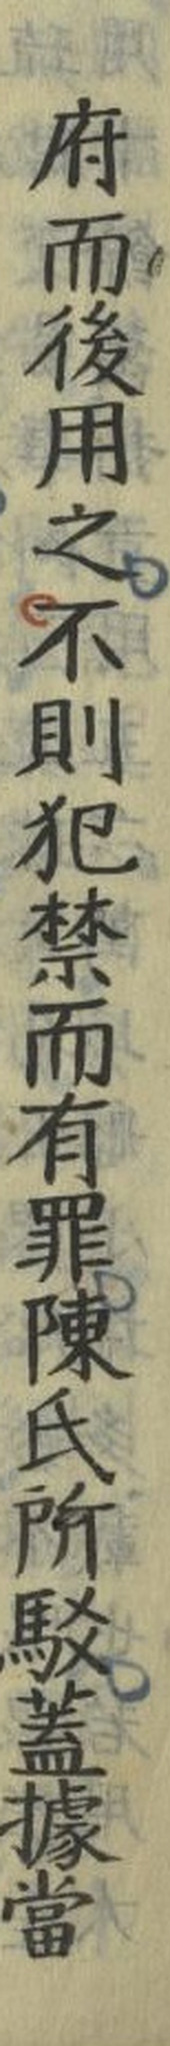府而後用之。不則犯禁而有罪。陳氏所駁。蓋據當
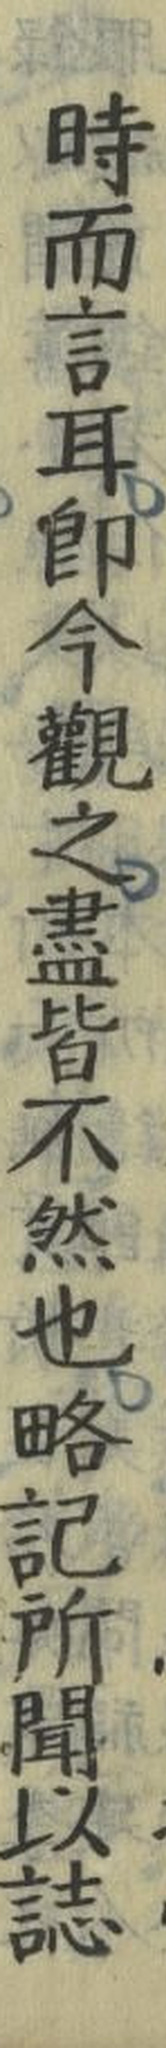時而言耳。卽今觀之。盡皆不然也。略記所聞以誌
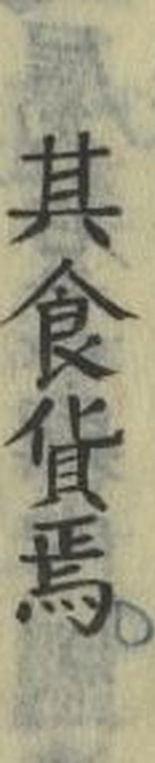其食貨焉。
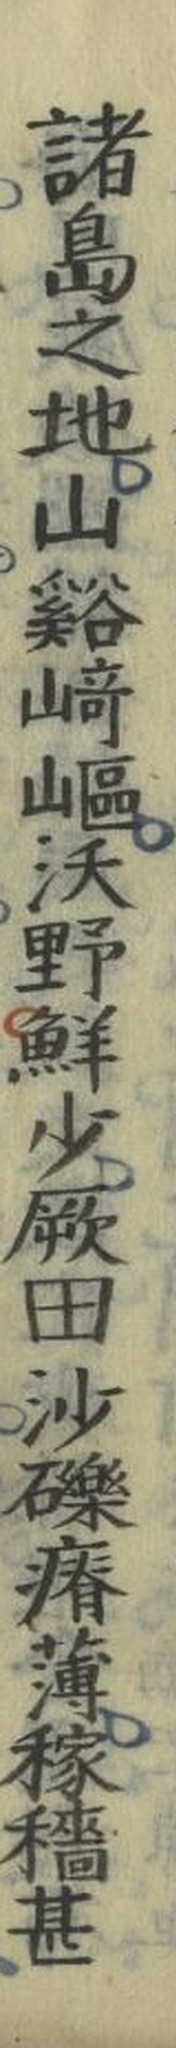諸島之地。山谿﨑嶇。沃野鮮少。厥田沙礫瘠薄。稼穡甚
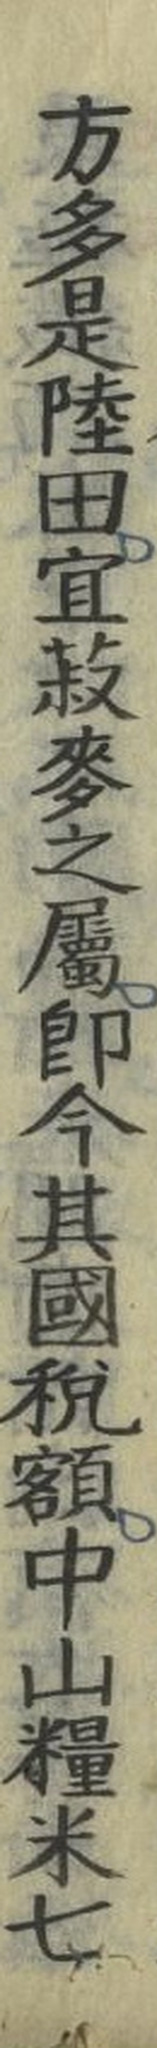方多是陸田。宜菽麥之屬。卽今其國稅額。中山糧米七
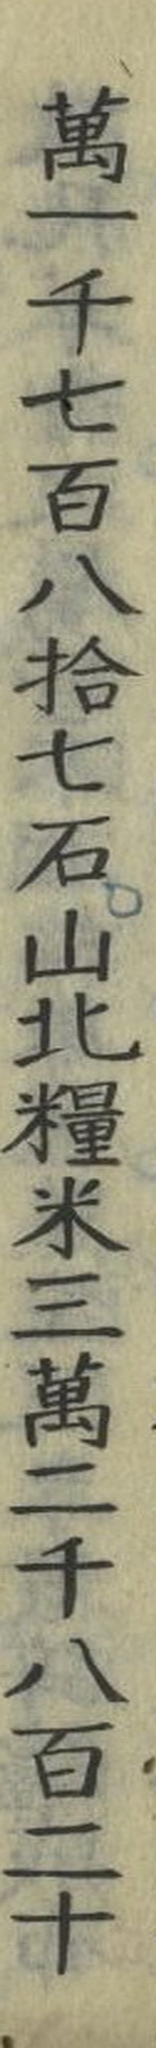萬一千七百八拾七石。山北糧米三萬二千八百二十
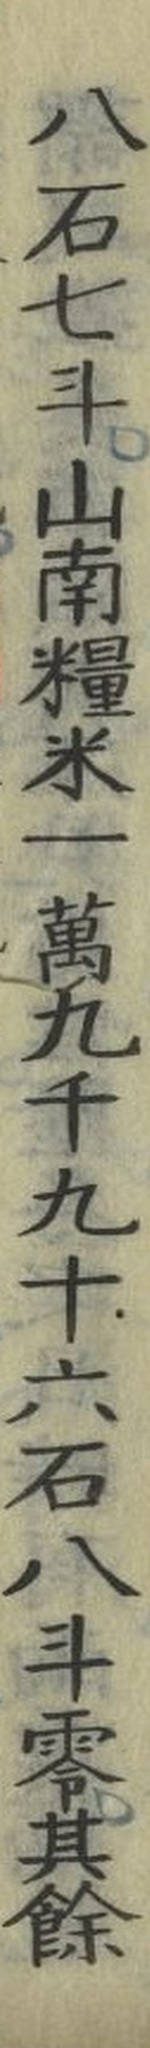八石七斗。山南糧米一萬九千九十六石八斗零。其

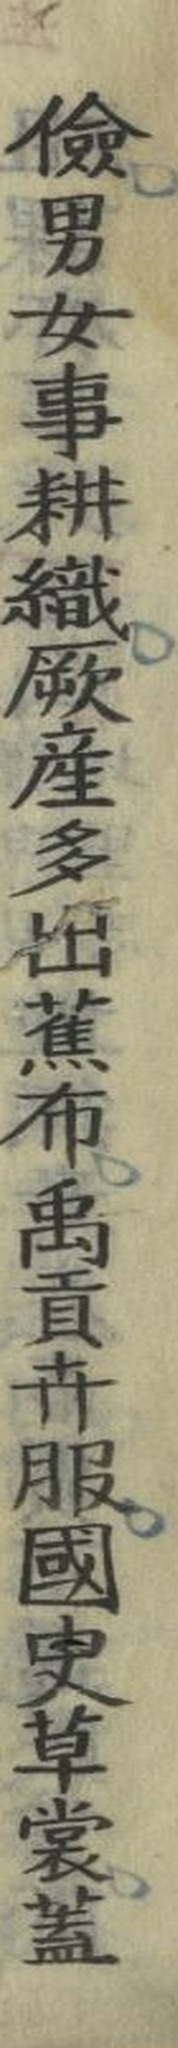儉。男女事耕織。厥産多出蕉布。禹貢卉服。國曳草裳。蓋
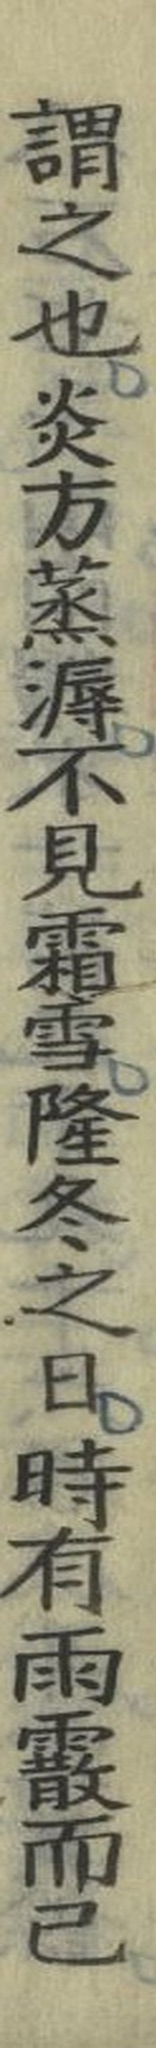謂之也。炎方蒸溽。不見霜雪。隆冬之日。時有雨霰而已。
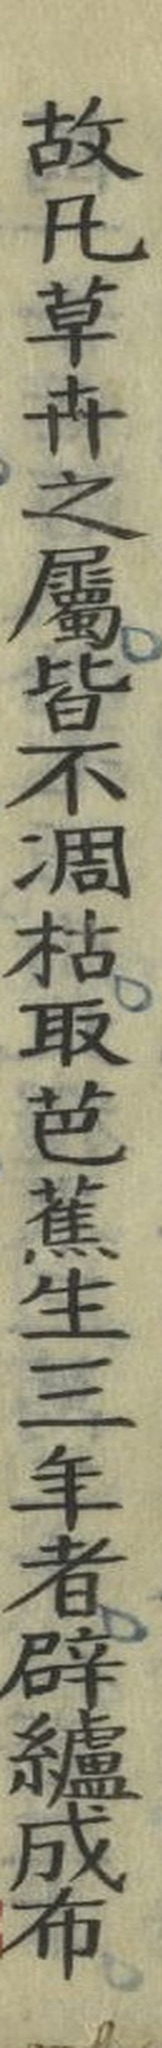故凡草卉之屬。皆不凋枯。取芭蕉三年者。辟纑成布。
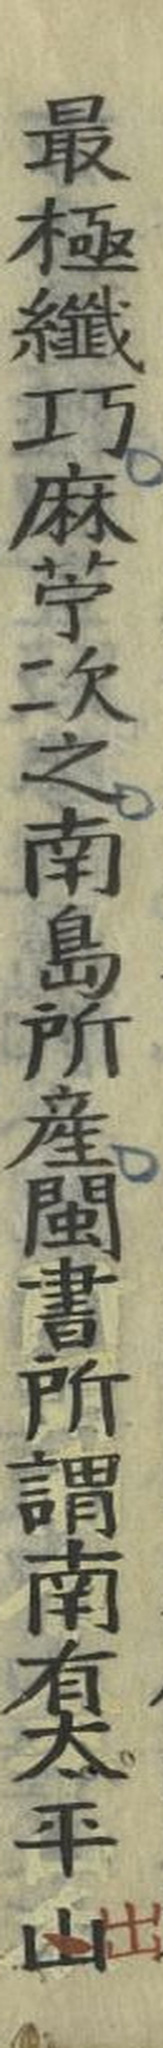最極纖巧。麻苧次之。南島所産。閩書所謂南有太平山出
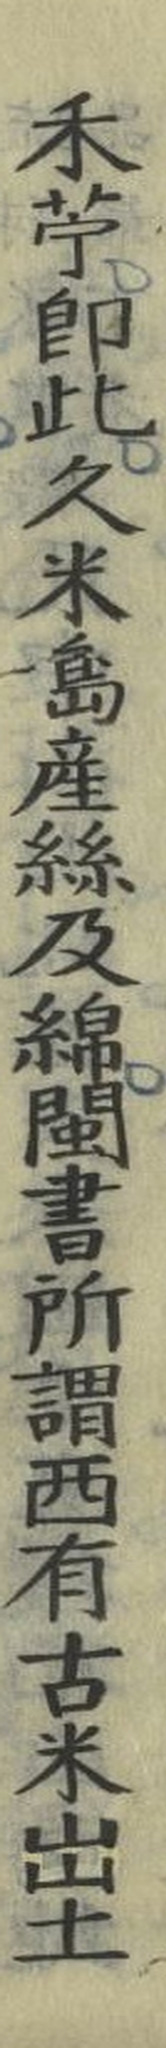禾苧。卽此。久米嶌産絲及綿。閩書所謂西有古米出土
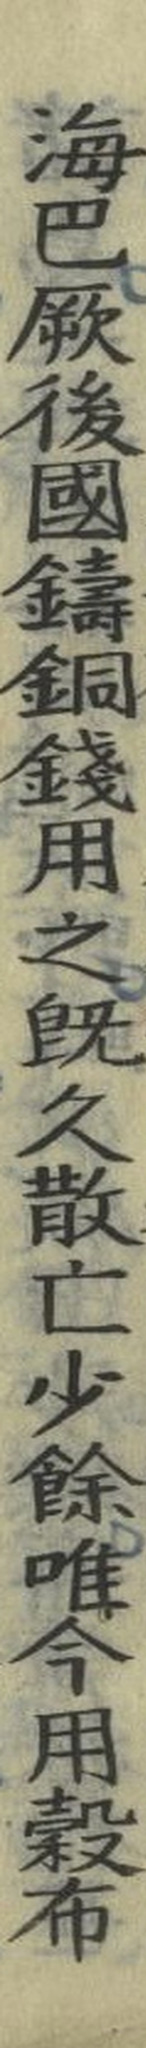海巴。厥後國鑄銅錢用之。既久散亡少餘。唯今用穀布
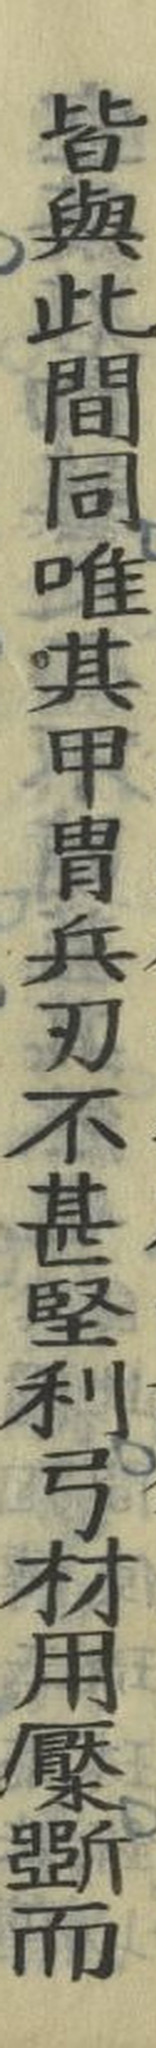皆與此間同。唯其甲冑兵刀不甚堅利。弓材用檿。斲
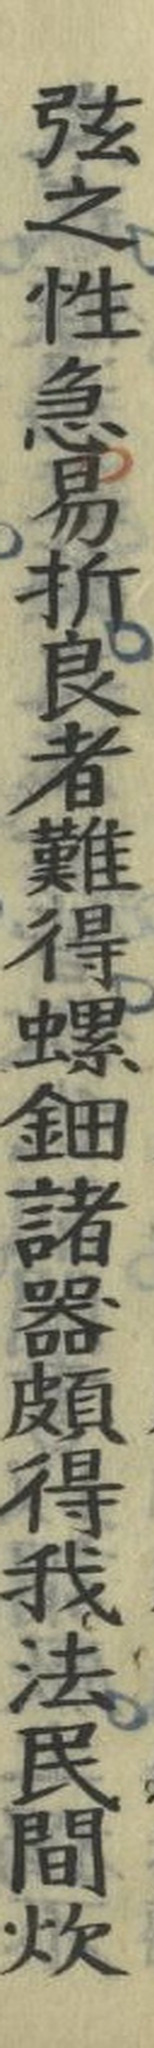弦之。性急易折。良者難得。螺鈿諸器頗得我法。民間炊
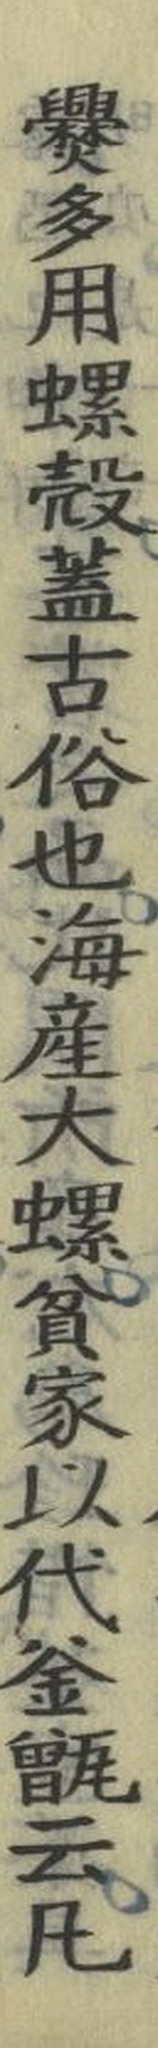爨多用螺殻。蓋古俗也。海産大螺。貧家以代釜甑云。凡
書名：南島志
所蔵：University of the Ryukyus Library
